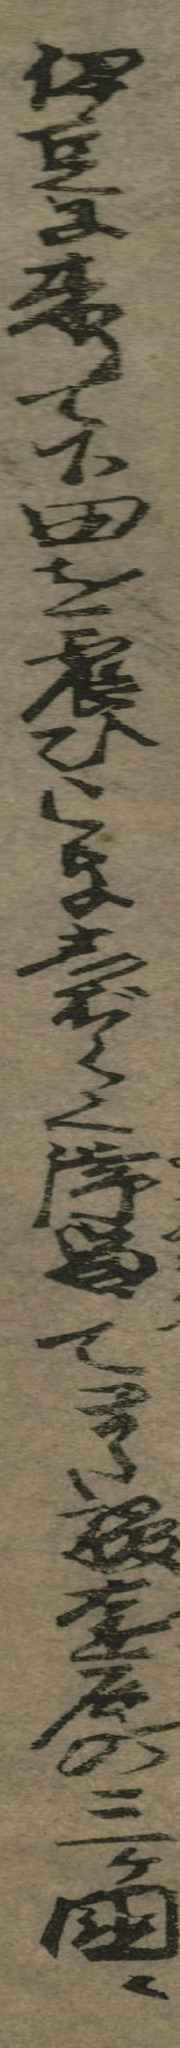伊豆に来りて下田を震ひこゝにしばらく滞留てまた駿遠尾の三ヶ国ニ
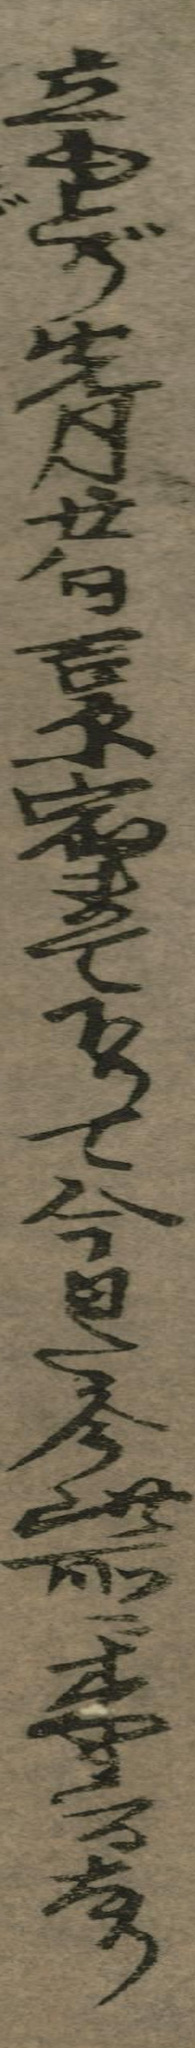立もどり先月廿ノ日吉原宿まて下りて今日たゝ今此所に来るなり
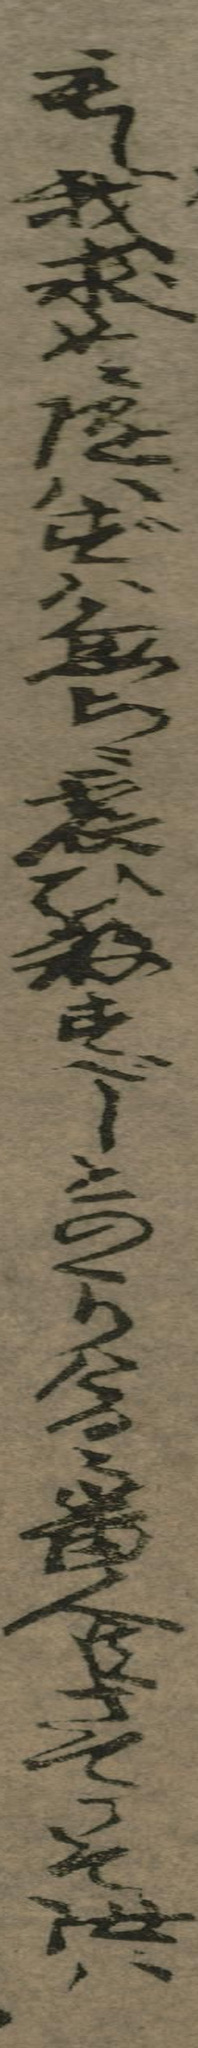もし我求めニ随はずは忽ちニ震ひ殺すべしとのくりけるニ番人共さてさて汝は
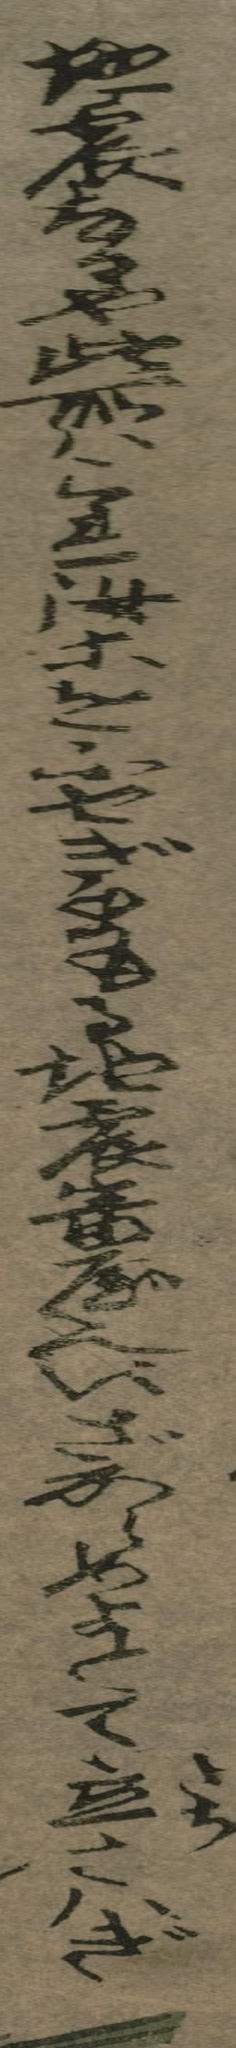地震なるや此所はこれ汝等をふせぎまもる地震番屋也いざからめよとて立さはぎ
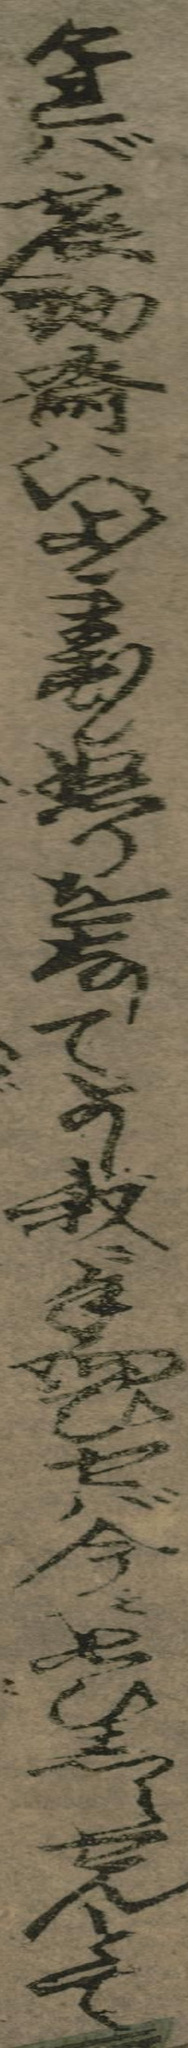ければ震動斎はいよ〳〵ます〳〵怒りをなしてよし我ニ手向ひせば今ニ思ひしらせんとて
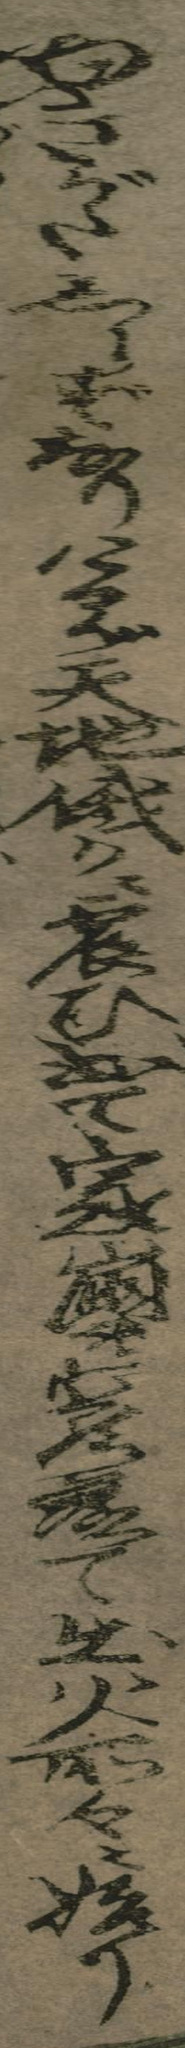ゆきがたしらずなりけるが天地俄かニ震ひ出て家崩れ蔵落て出火所〻ニ始り
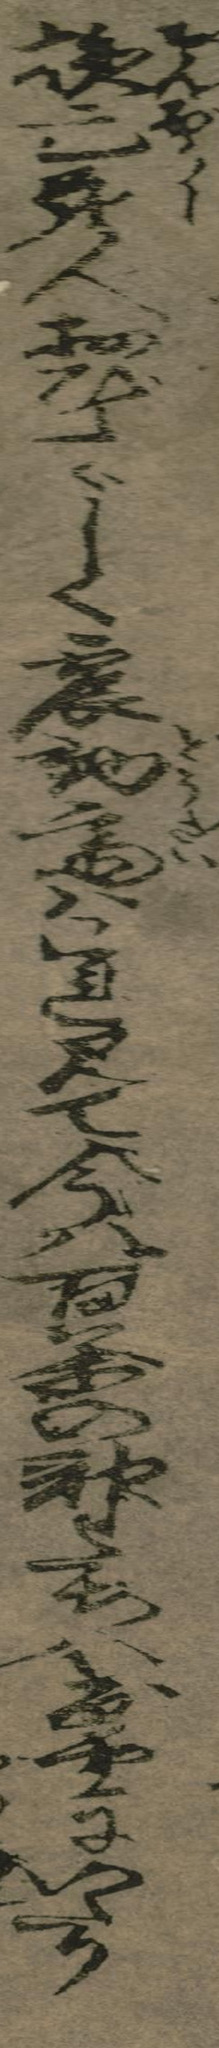損亡死人おびたゞしく震動斎はこれ見て今は八百萬の神たちは出雲にいたり
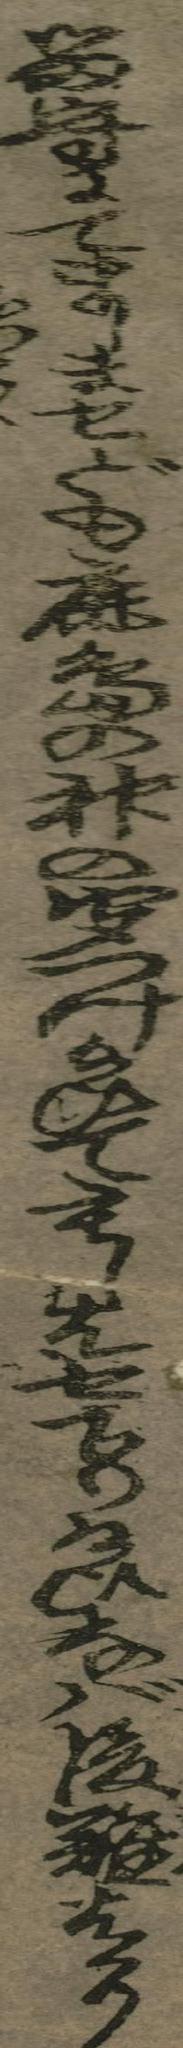留守にてましませども鹿島の神の聞つけ給ひてもしはせ下り給ひなば後難はかり
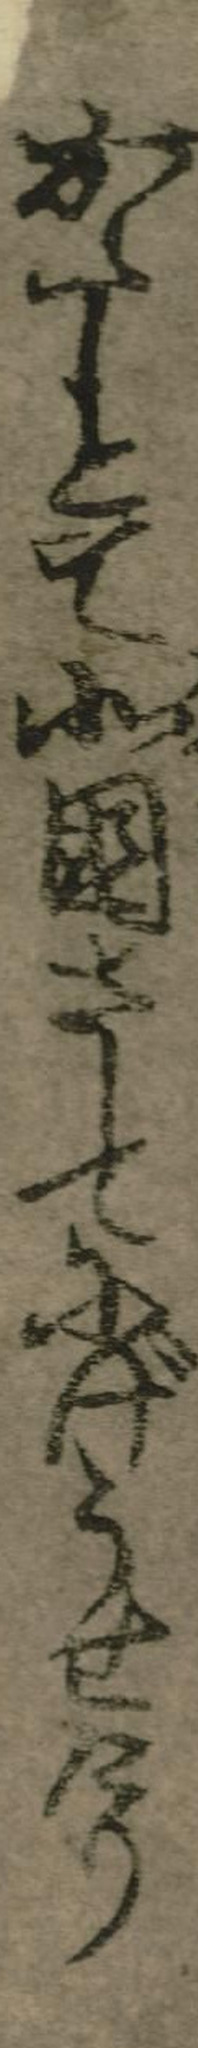かたしとて北国さしてにげうせたり
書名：鯰之讎討
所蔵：東京大学地震研究所図書室 Earthquake Research Institute Library, The University of Tokyo, JAPAN
